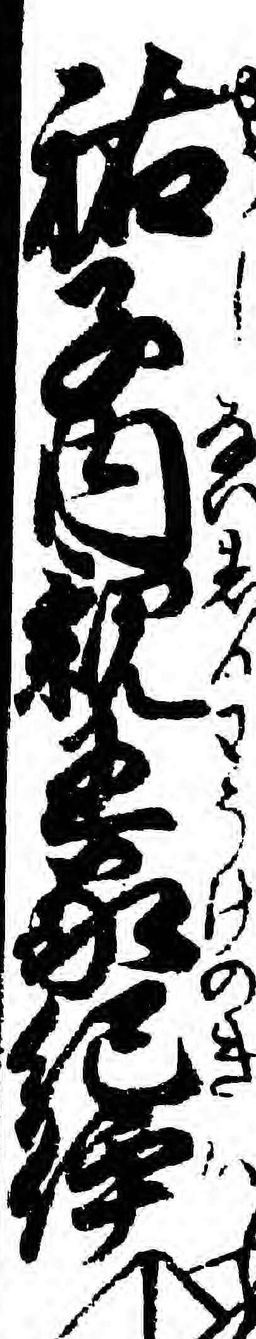祐子内親王家紀伊
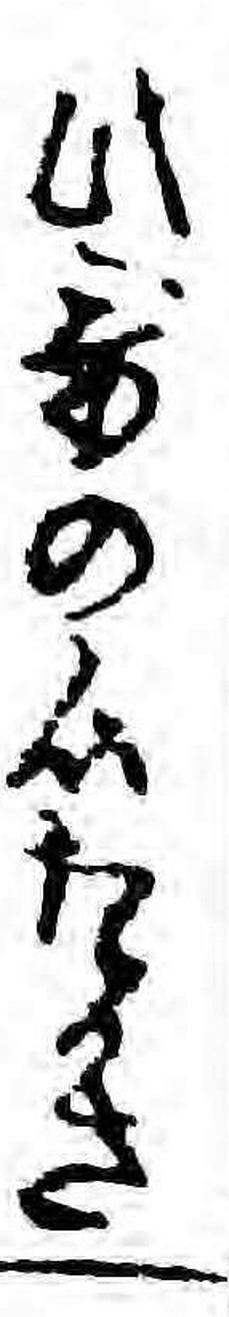此哥の心たかさ
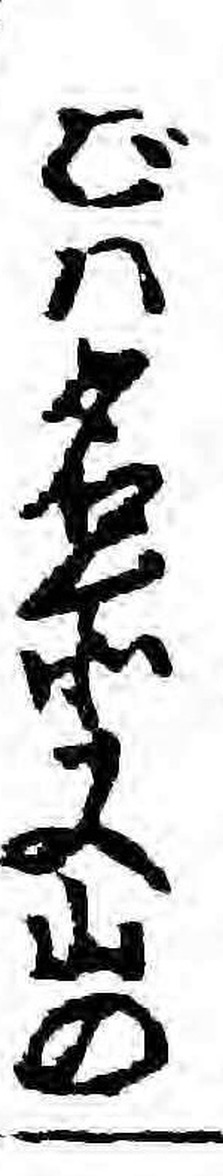ごは名所又山の
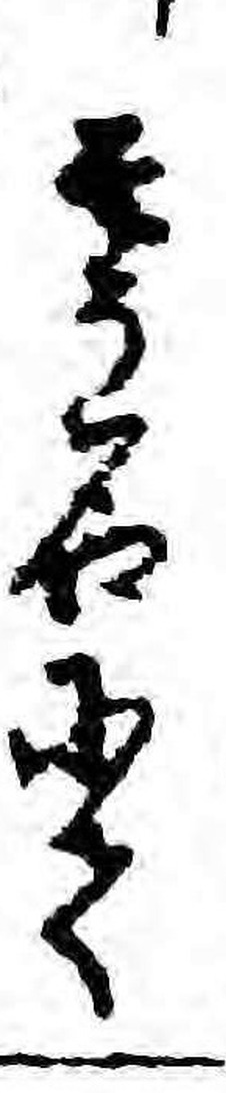そう名にて
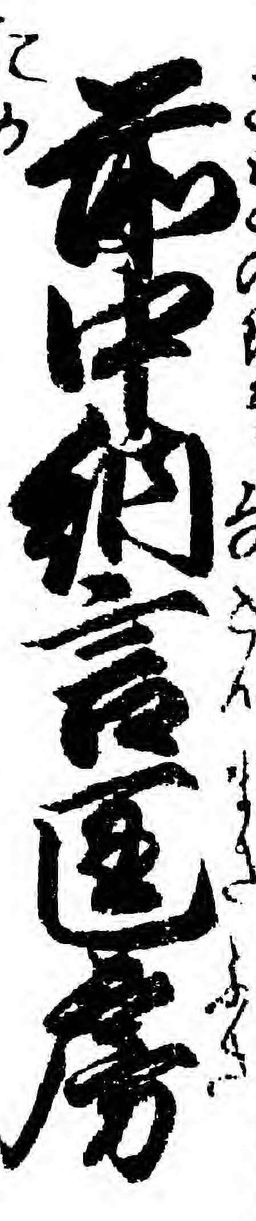前中納言匡房
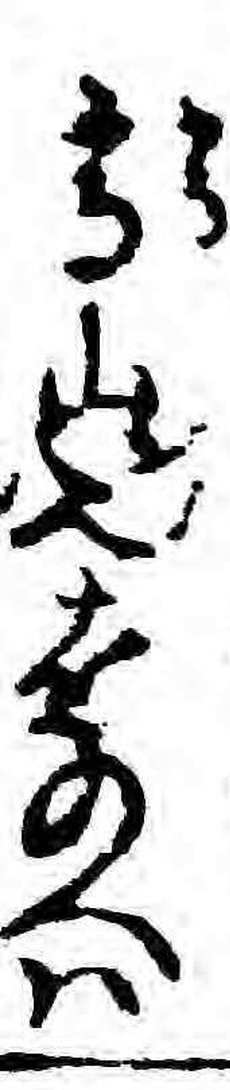高山也をのへは
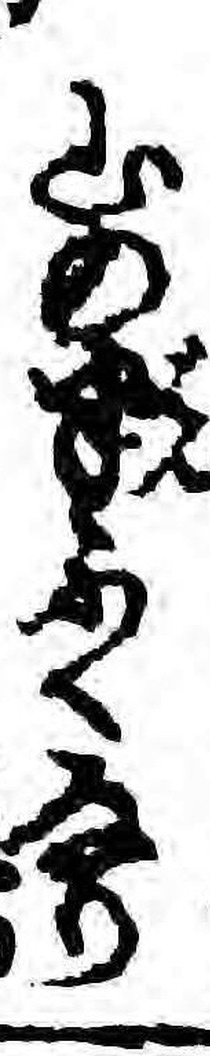山の半ふくなり
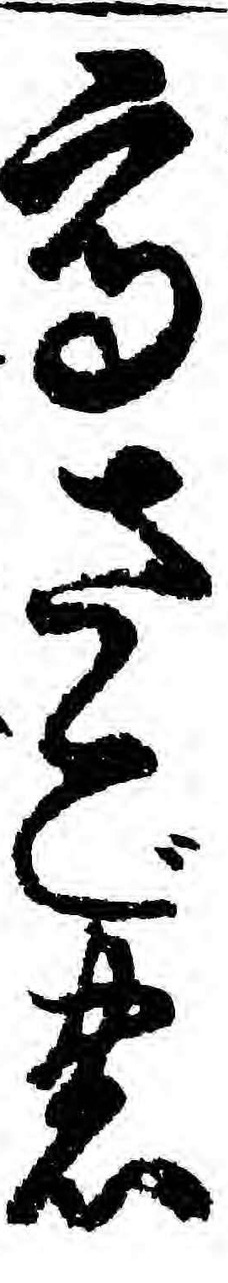高さごの
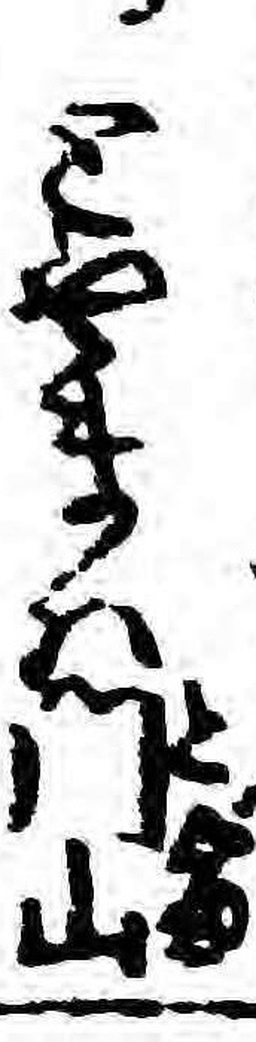とやまは門山
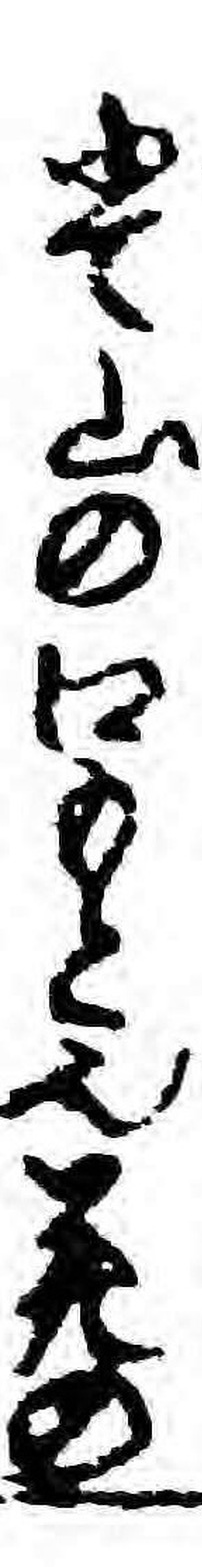にて山の口もと也花の
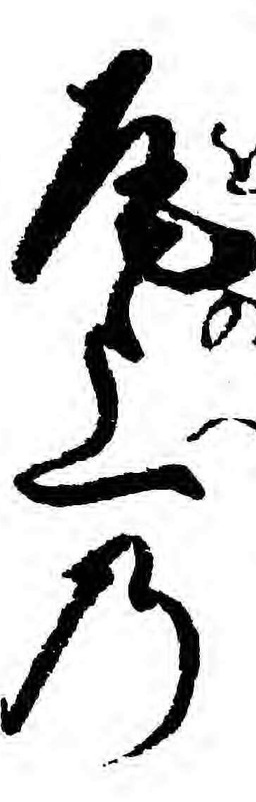尾上の
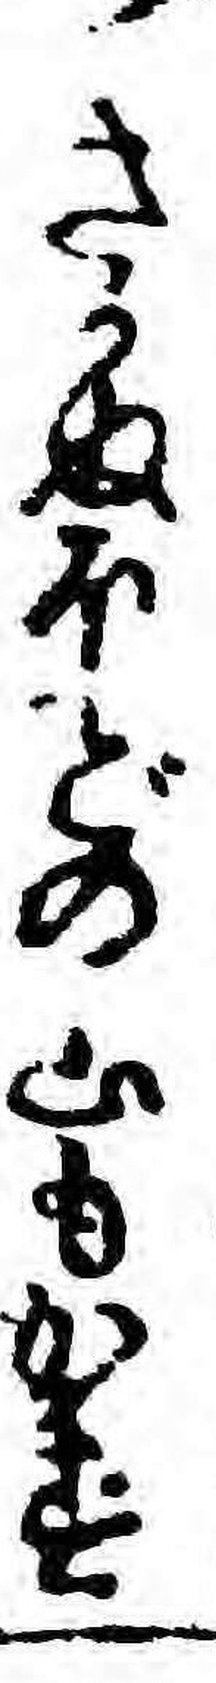さかぬほどの山もかず
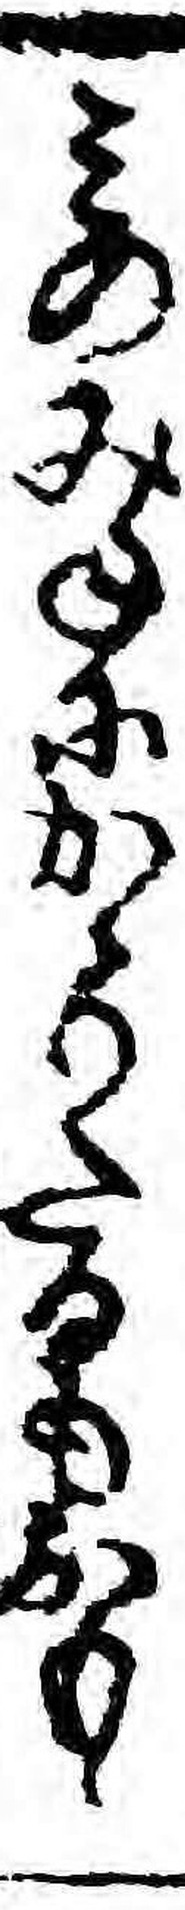みのみねにかゝりたるもおもし
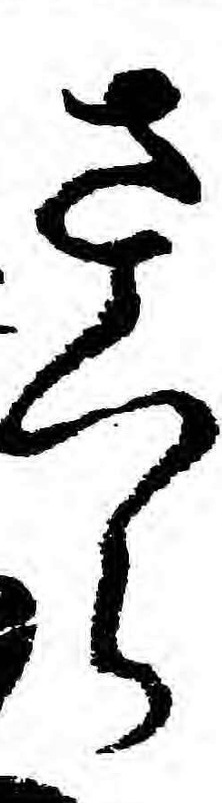さくら
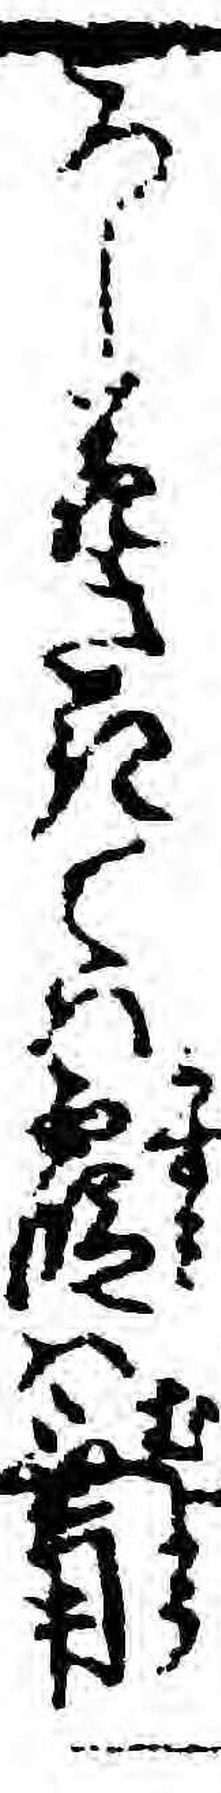ろし花さきては霞は無用
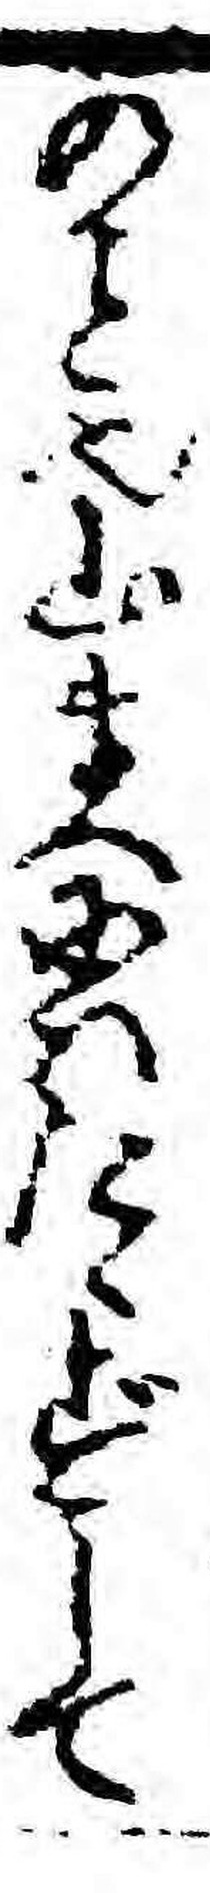のこと也山まへにはたゝずして
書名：頭書和歌注譯／壽賀多百人一首小倉錦
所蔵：国文学研究資料館
